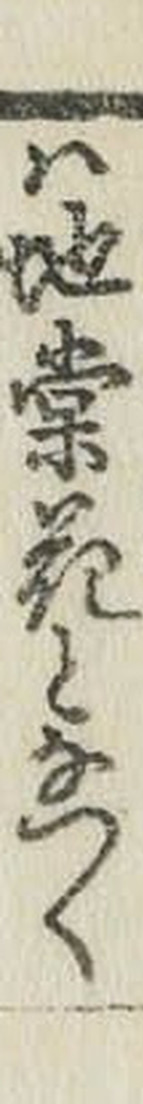は地棠花となつく
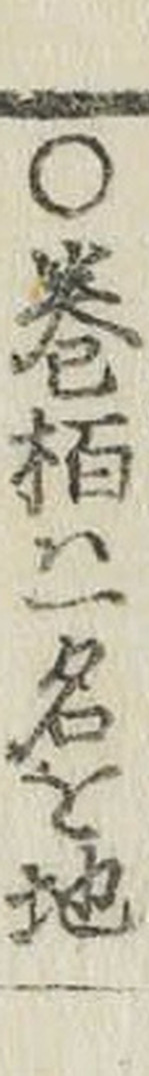○巻栢は一名を地
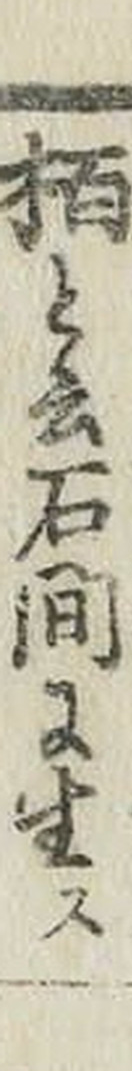栢と云石間に生す
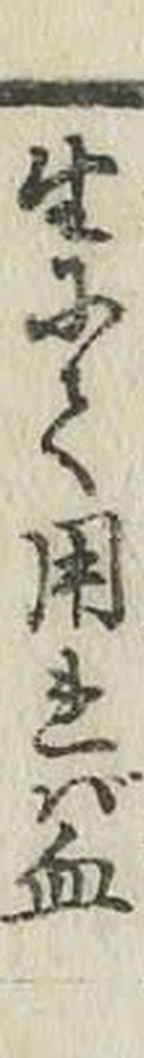生にて用れば血
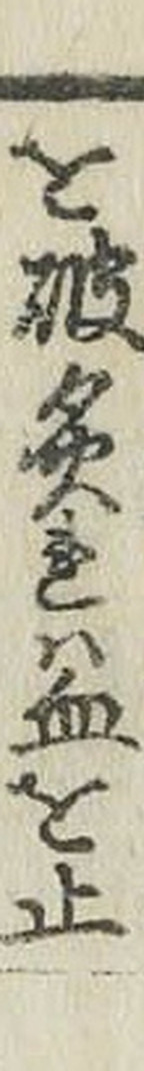を破炙れは血を止
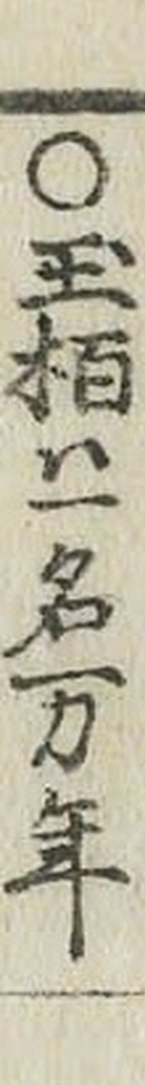○玉栢は一名万年
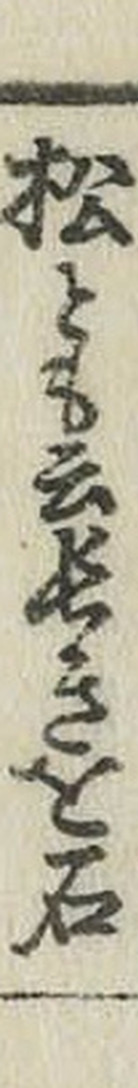松とも云長きを石
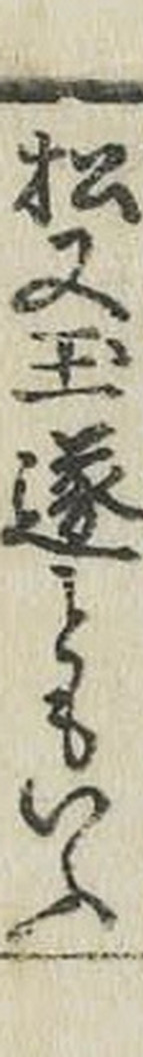松又玉遂ともいふ

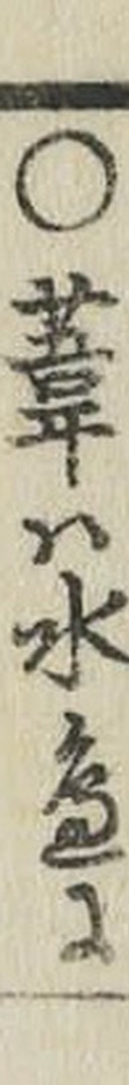○葦は水辺に
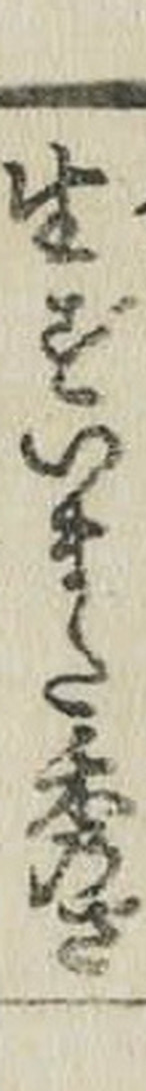生ずいまた秀ざ
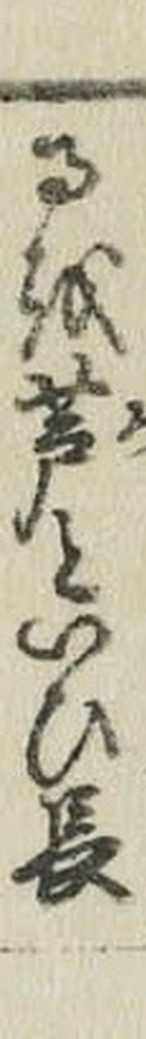るを芦といひ長
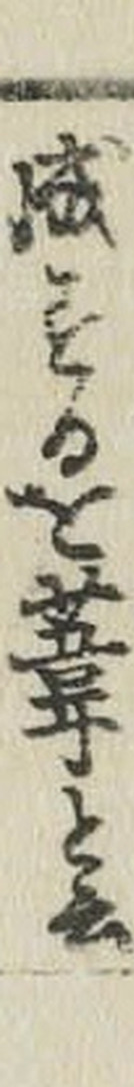生するを葦と云
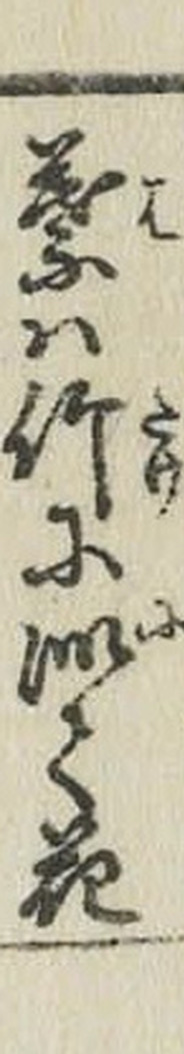葉は竹に似て花
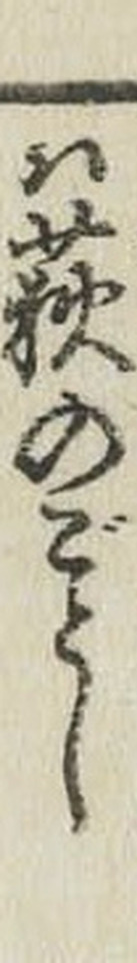は荻のごとし
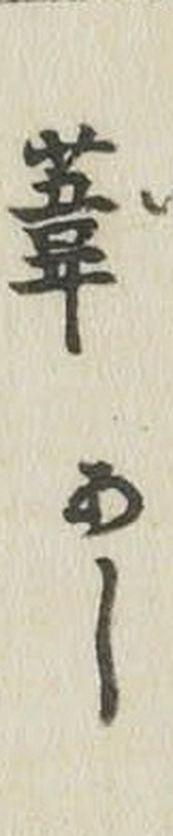葦あし
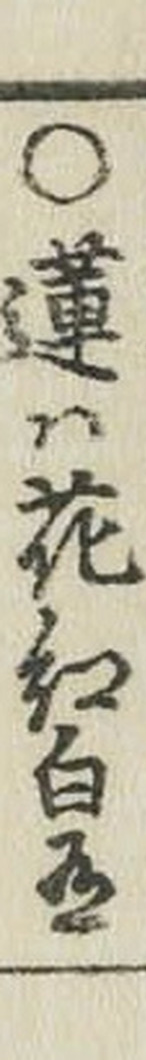○蓮は花紅白有
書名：増補頭書訓蒙図彙大成 10巻 9:巻之20
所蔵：東京学芸大学教育コンテンツアーカイブ
